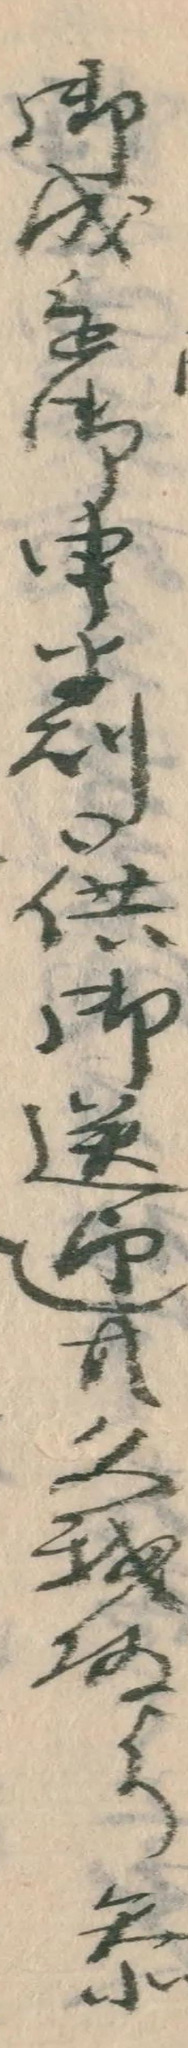御成置御申半刻御供御送迎共久我殿より参
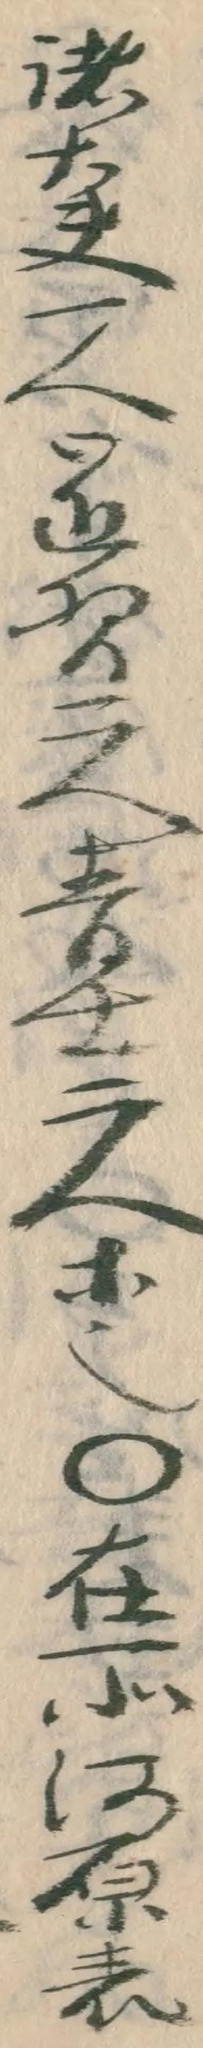諸大夫一人御近習二人青士二人等也○在所河原表
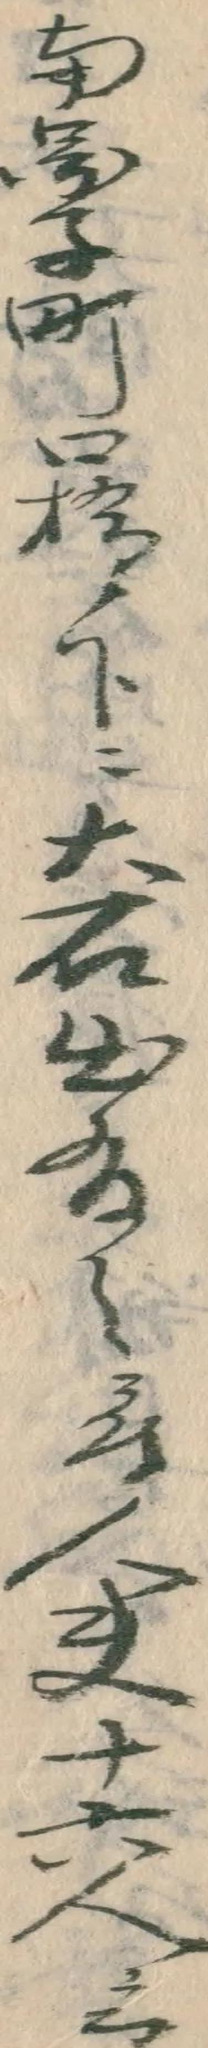南図子町御橋ノ下ニ大石出有之ニ付人夫十六人ニ而
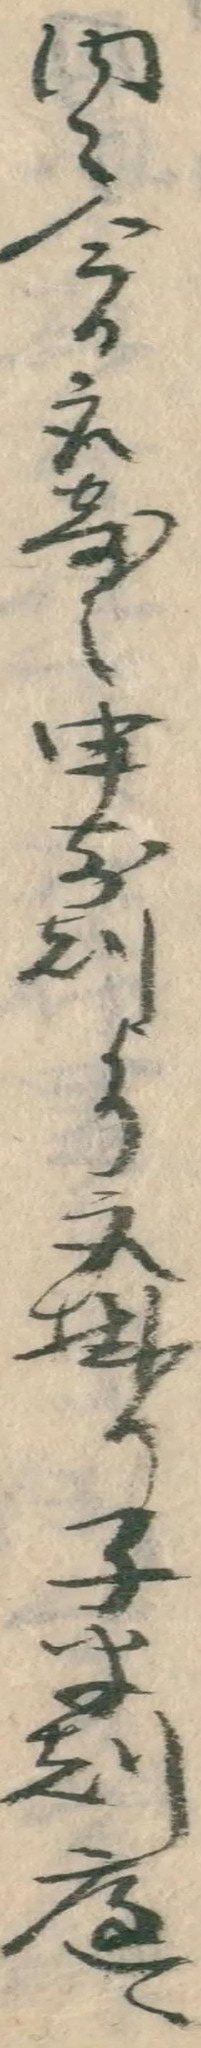内々今日取寄之申前刻より取掛リ子半刻庭へ
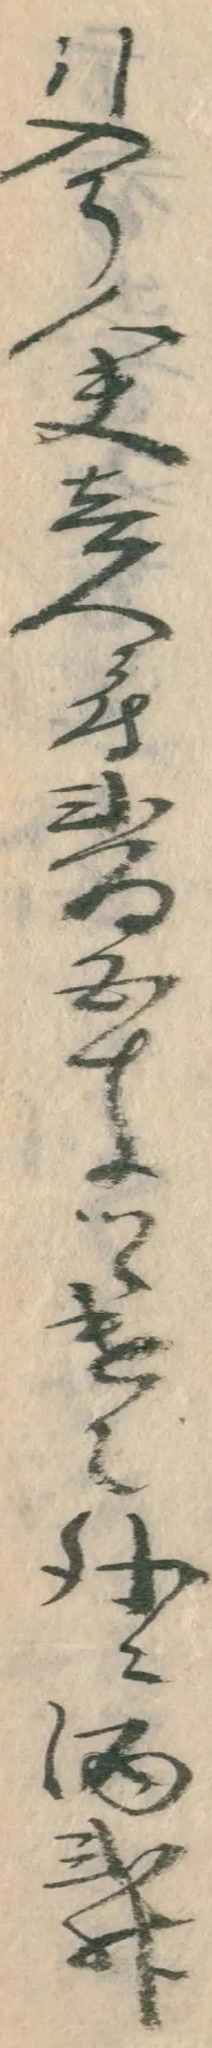引入了人夫壱人ニ付弐百五十匁ツヽ遣候外ニ酒弐升

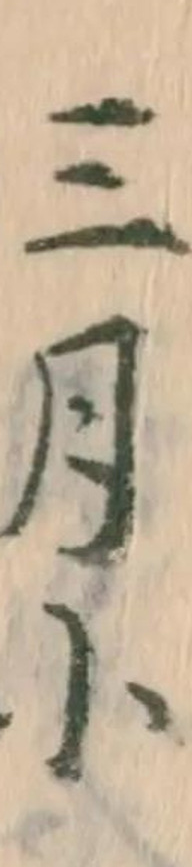三月小
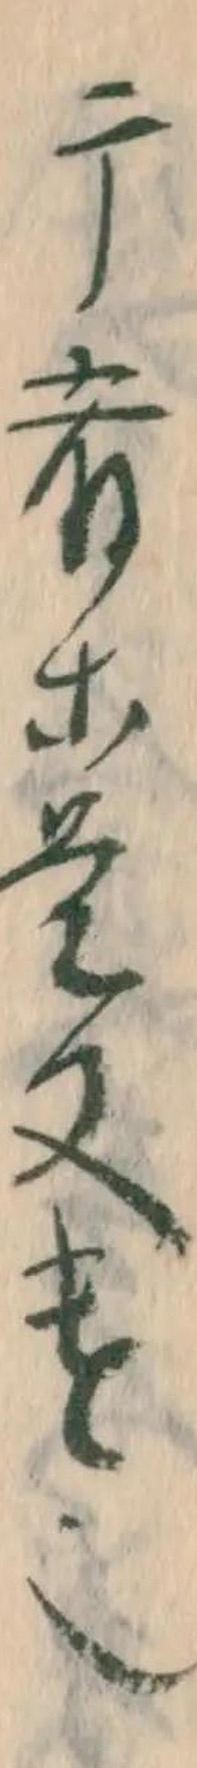干肴等是又遣也
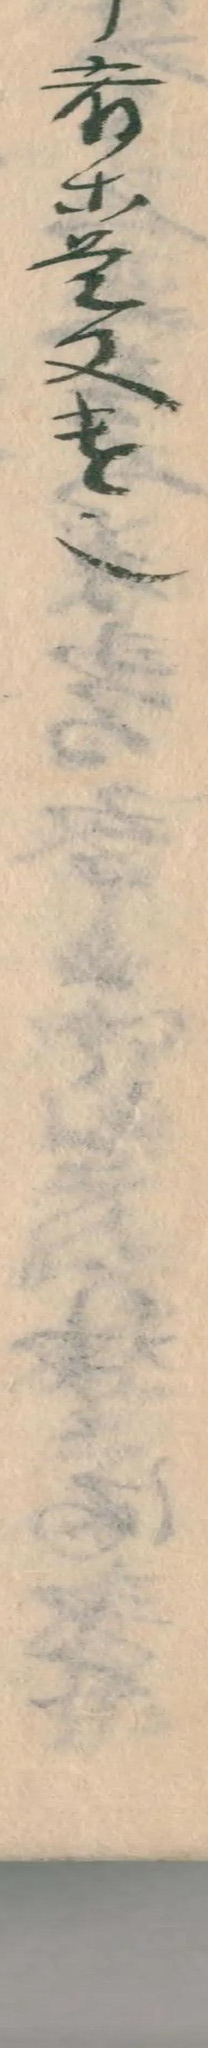干肴等是又遣也
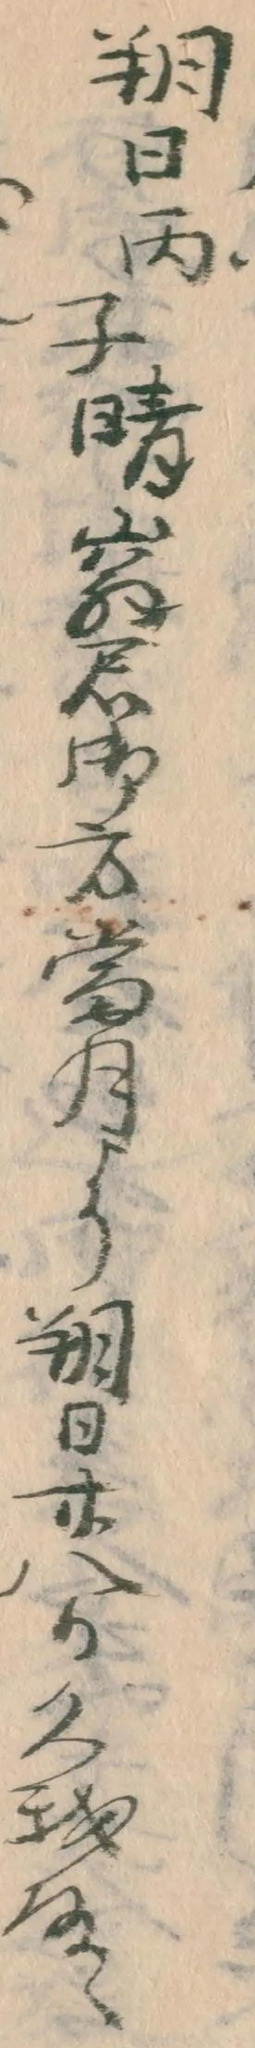朔日丙子晴嵡君御方當月より朔日廿八日久我殿へ
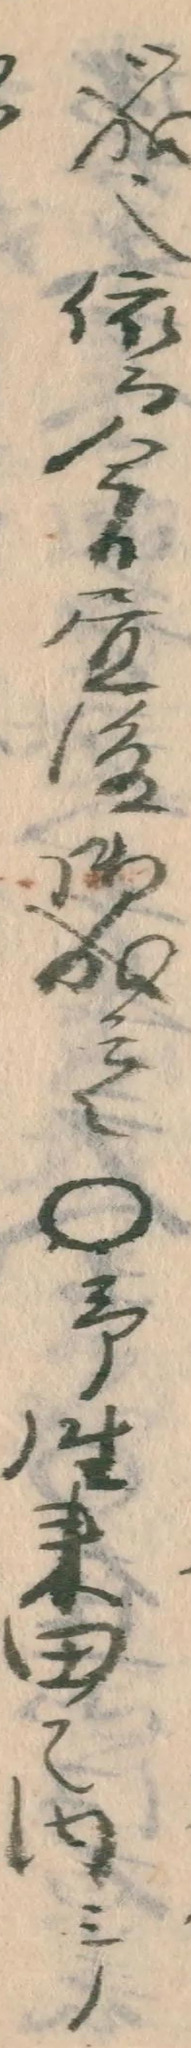御成也依而今日昼後御成云々○予往来田之内三ノ
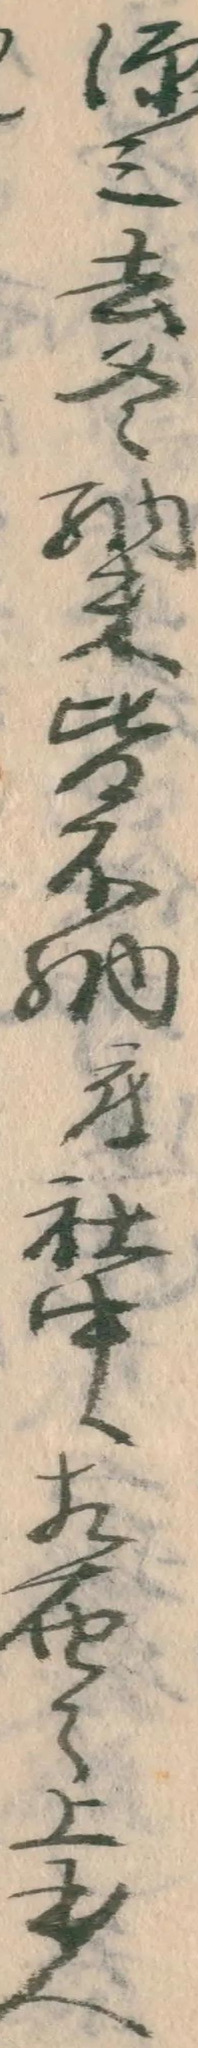源三去冬納来皆不納ニ付社中へ相届之上本人
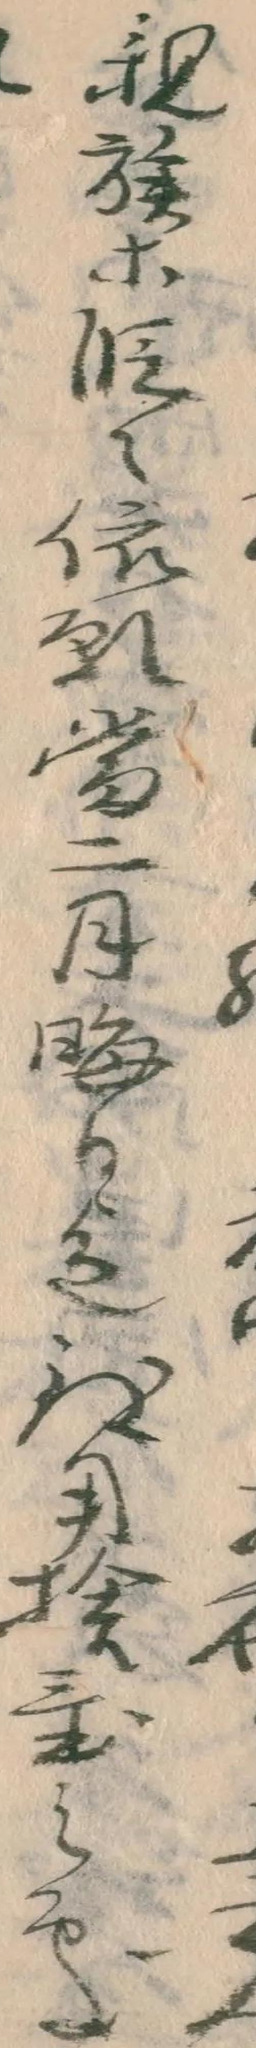親族等段々依願當二月晦日迄致用捨置之處
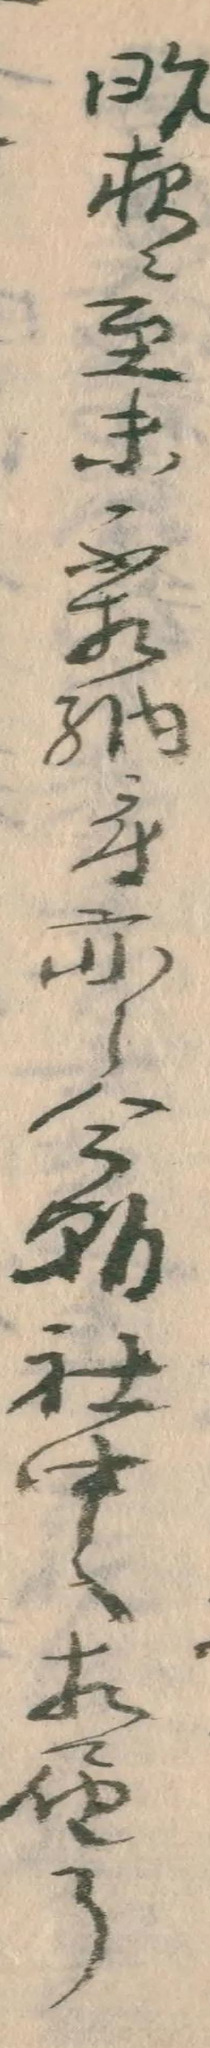昨夜ニ至末不相納ニ付亦々今朝社中へ相届了
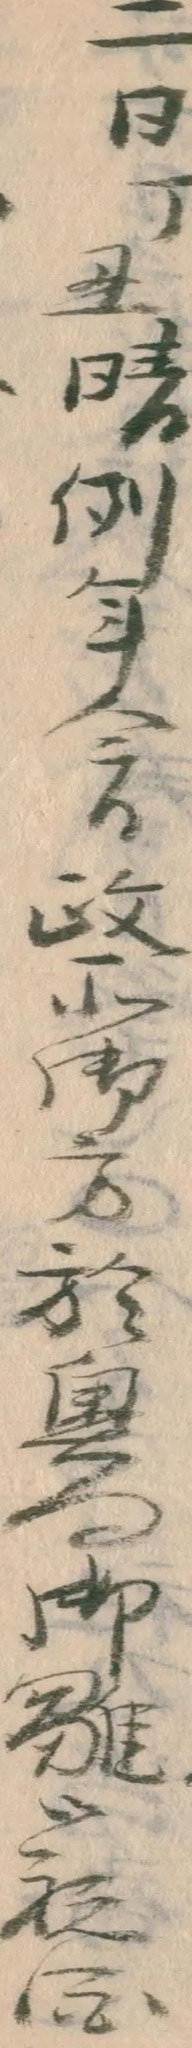二日丁丑晴例年今日政所御方於奥向御雛御祝酒
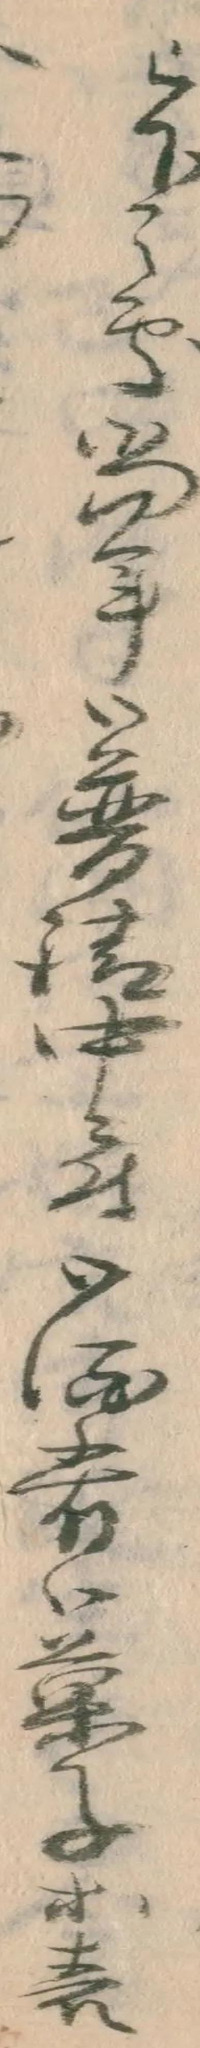被下之處當年御普請中ニ付御酒肴御菓子等表
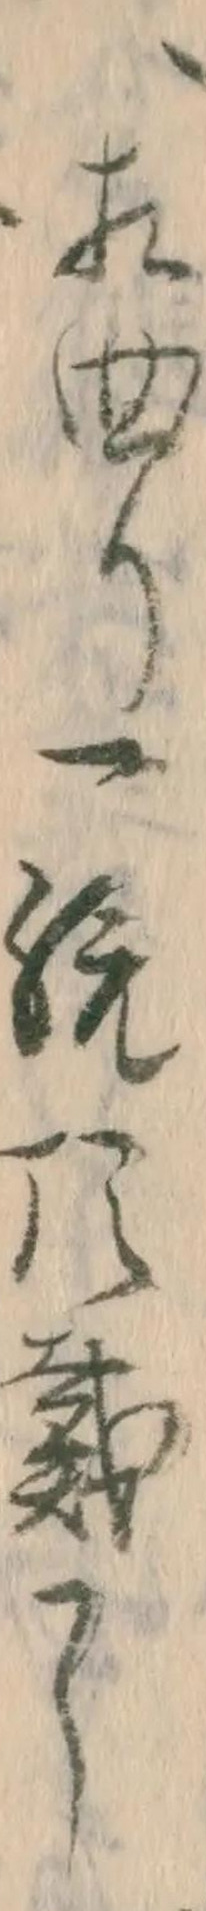へ相回り一統頂戴了
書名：賀茂社記録. 第63冊
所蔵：国立国会図書館 National Diet Library, JAPAN
